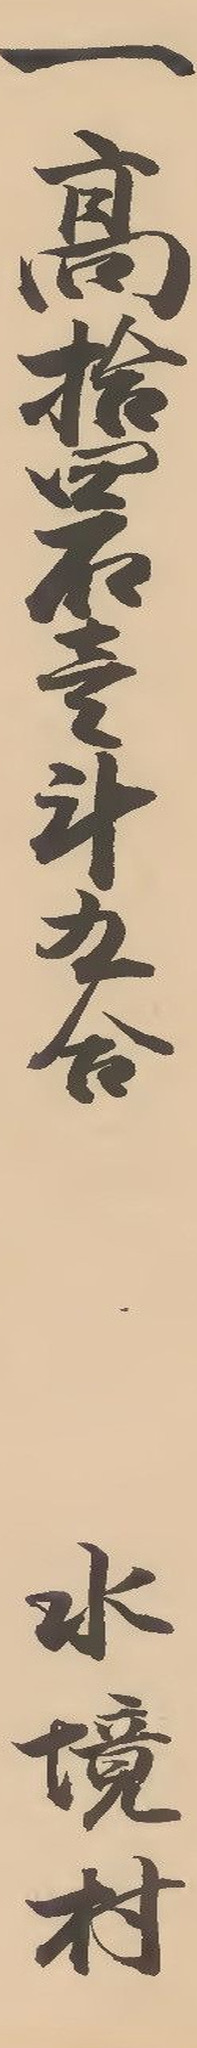一高拾四石壱斗九合水境村
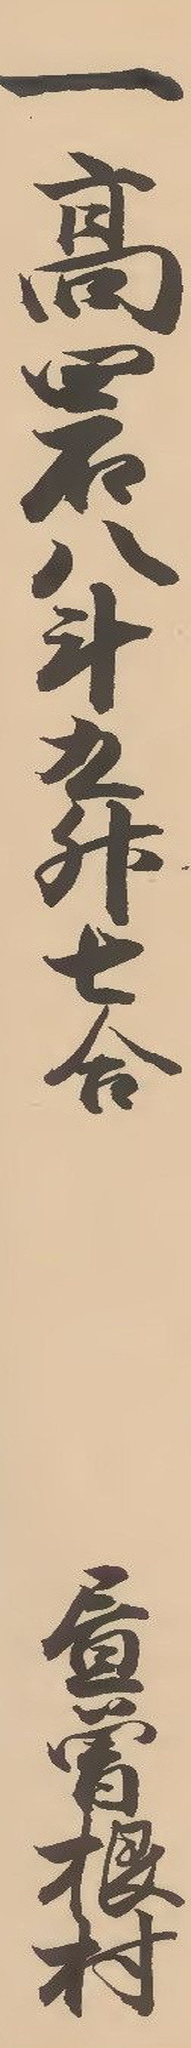一高四石八斗九升七合昼曽根村
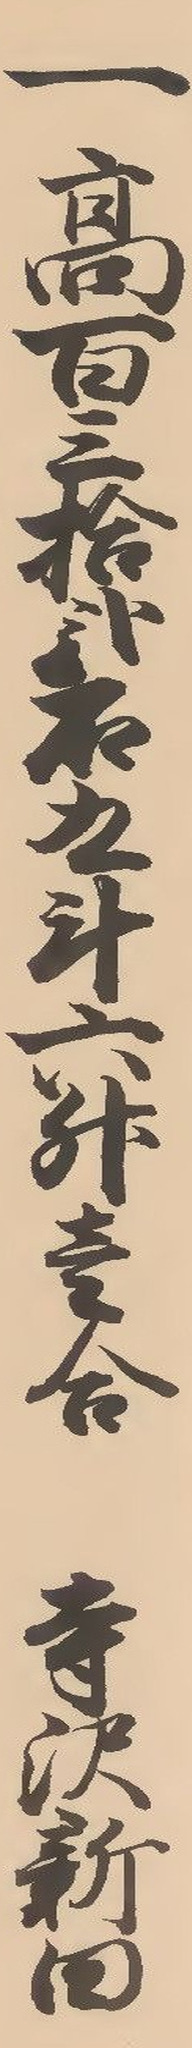一高百三拾弐名九斗六升壱合寺沢新田
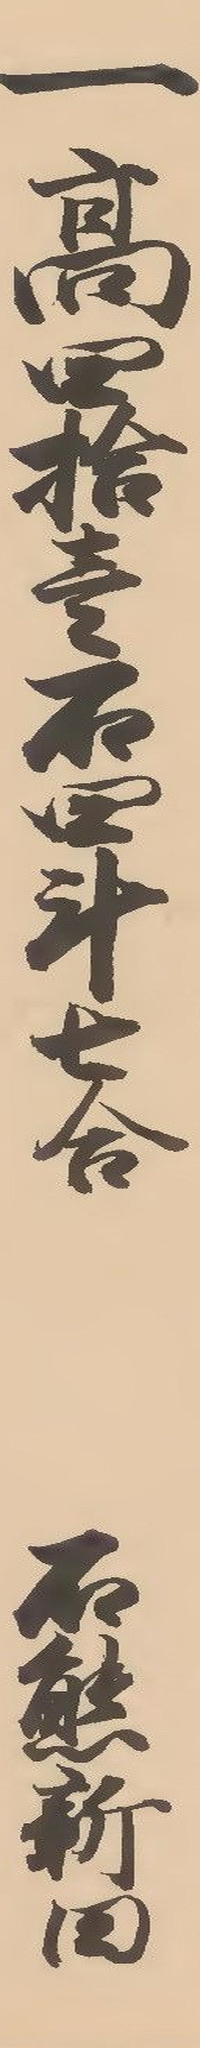一高四拾壱石四斗七合石熊新田
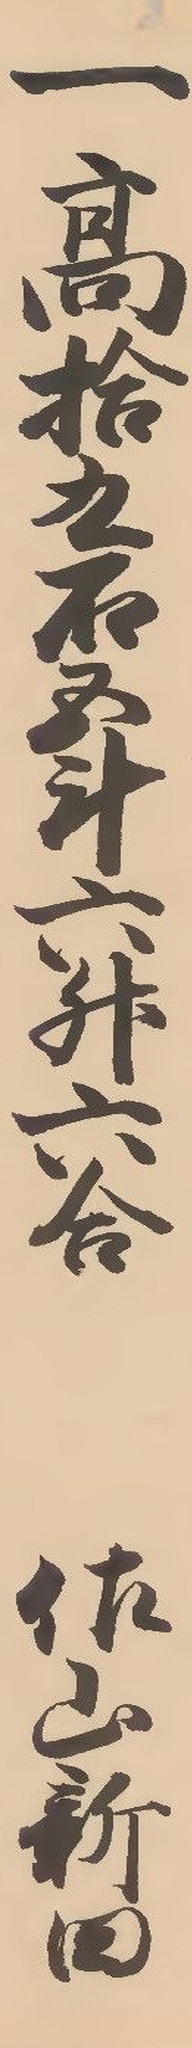一高拾九石五斗六升六合佐山新田
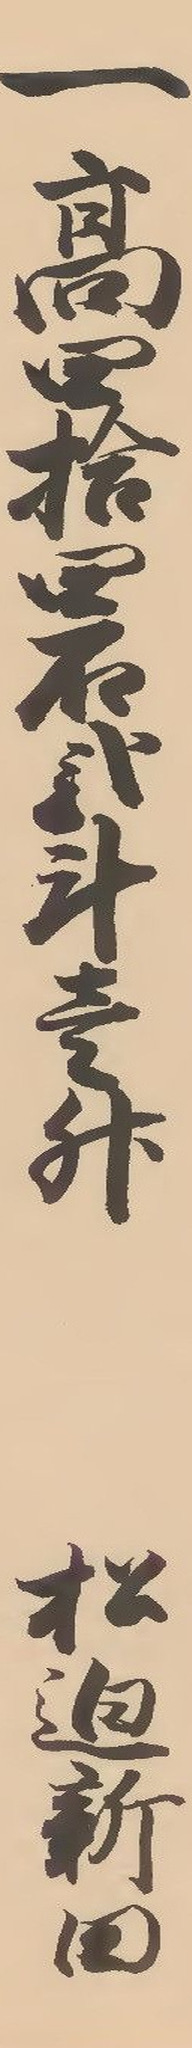一高四拾四石弐斗壱升松迫新田

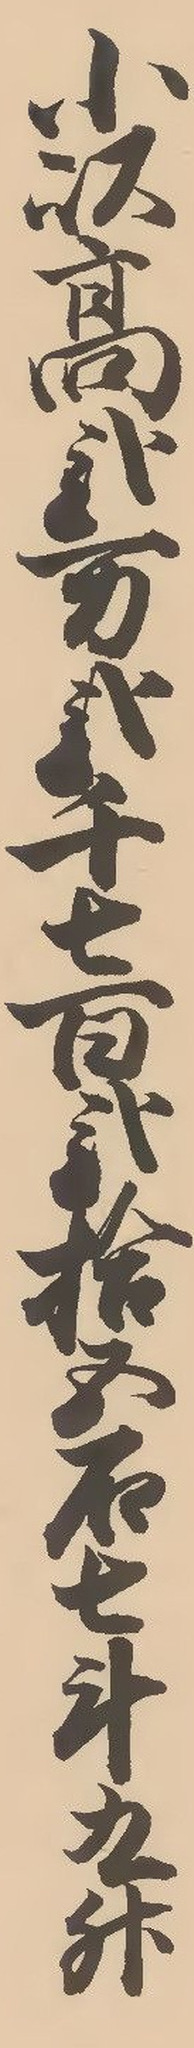小以高弐万弐千七百弐拾五石七斗九升
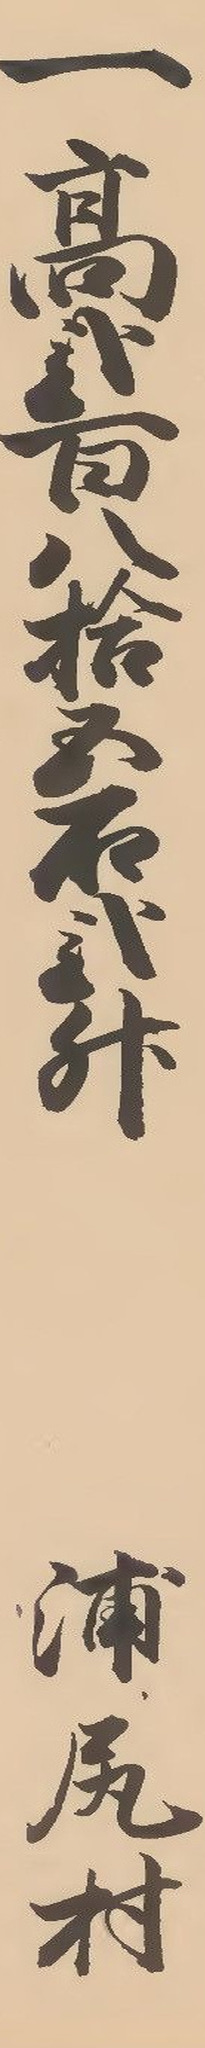一高弐百八拾五石弐升浦尻村
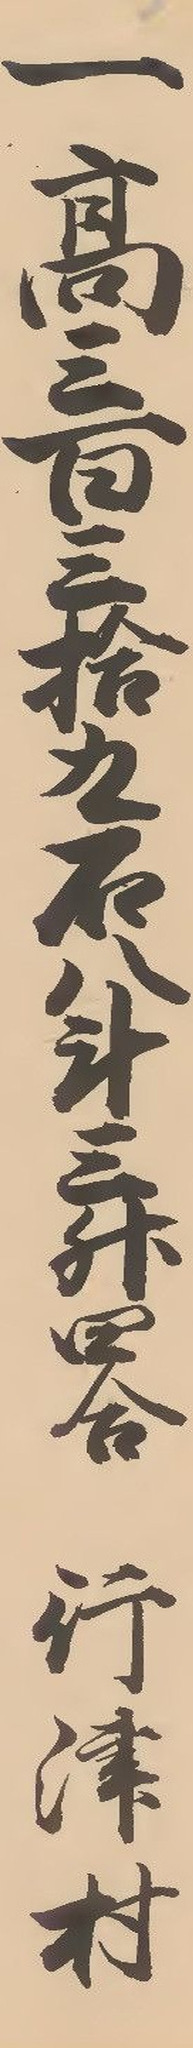一高三百三拾九石八斗三升四合行津村
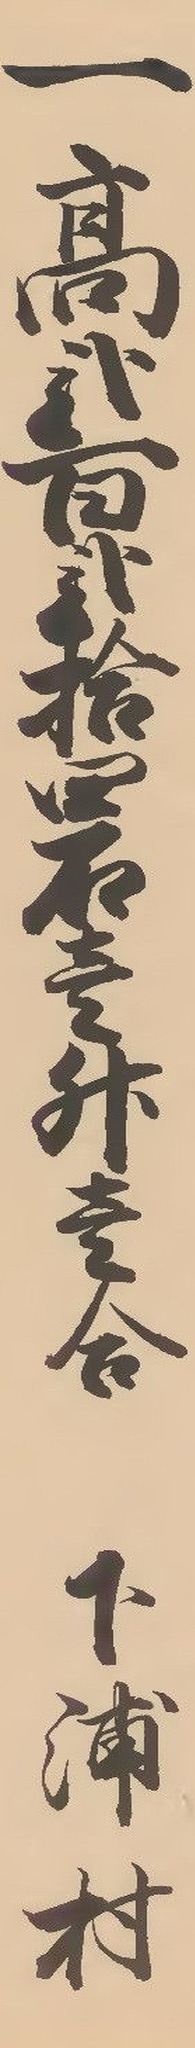一高弐百弐拾四石壱升壱合下浦村

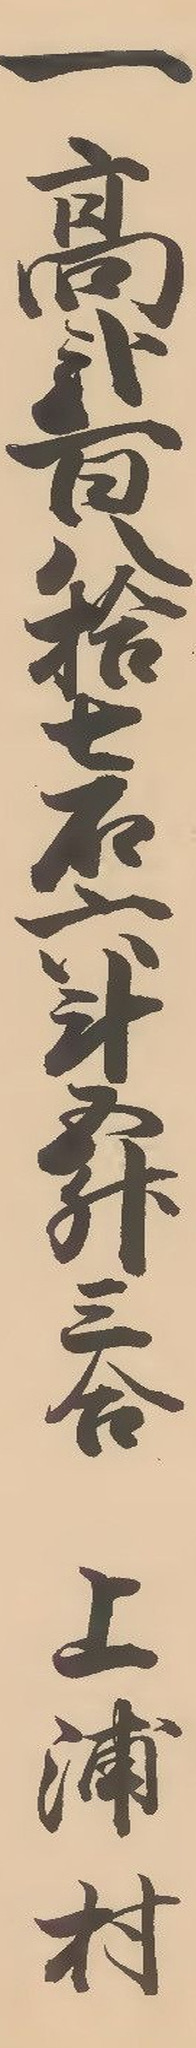一高弐百八拾七石六斗五升三合上浦村
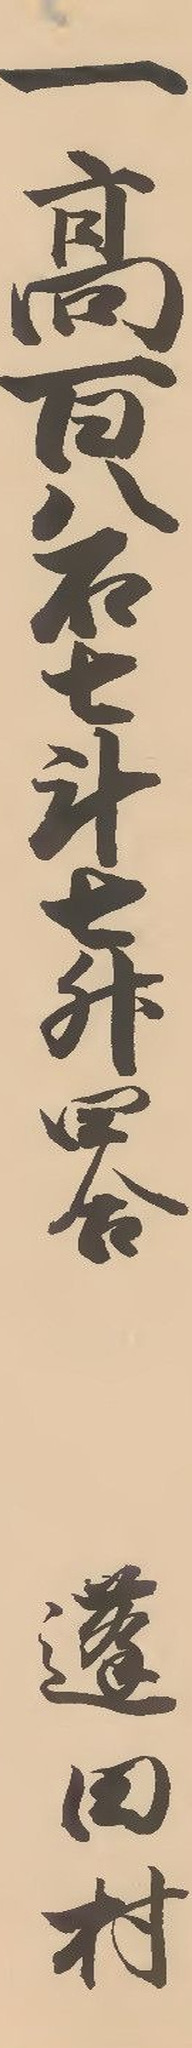一高百八石七斗七升四合蓬田村
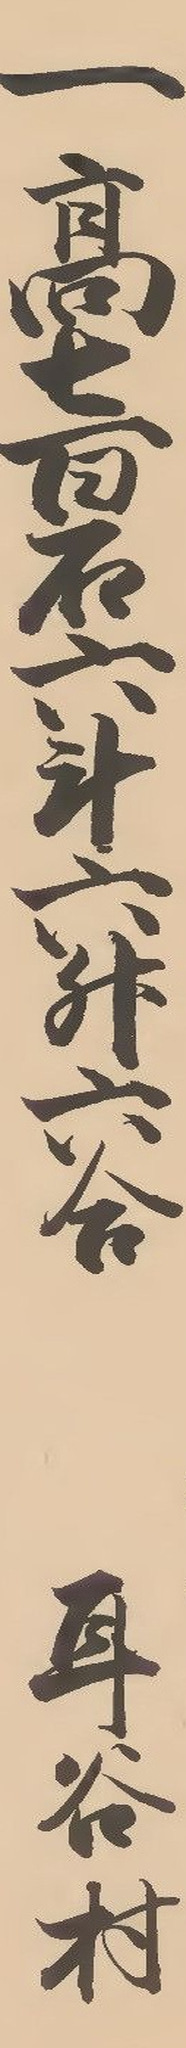一高七百石六斗六升六合耳谷村
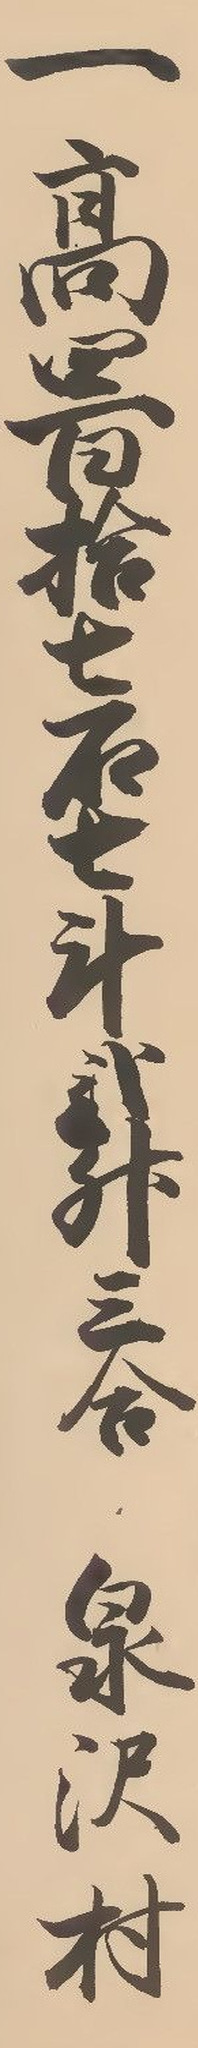一高四百拾七石七斗弐升三合泉沢村
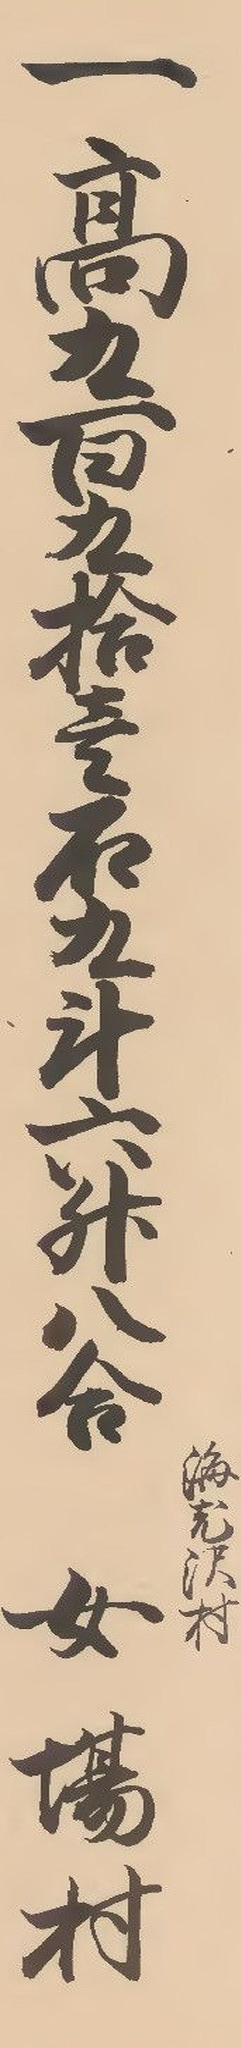一高九百九拾壱石九斗六升八合女場村
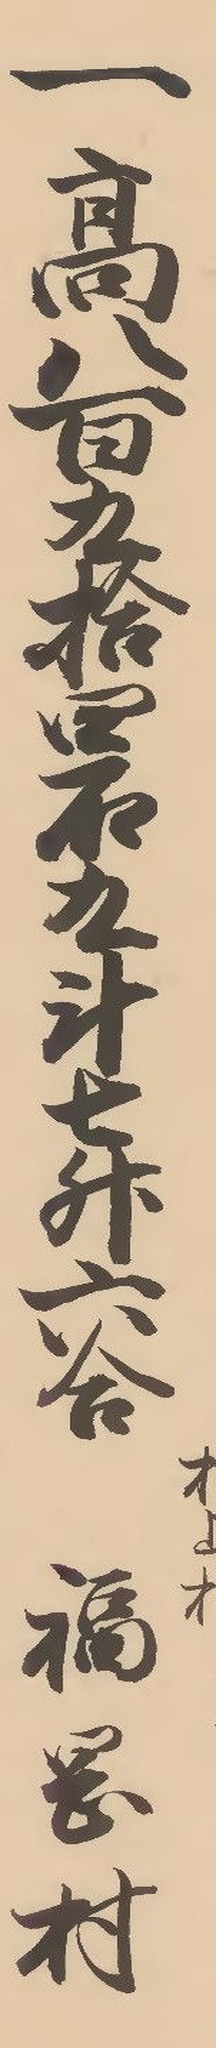一高八百九拾四石九斗七升六合福岡村
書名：陸奥国郷帳　３
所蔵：国立公文書館 National Archives of Japan
